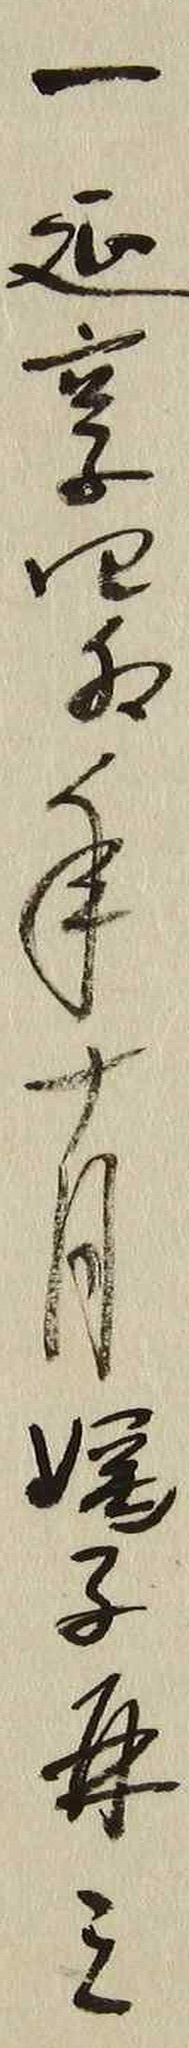一延享四卯年十月嫡子再之
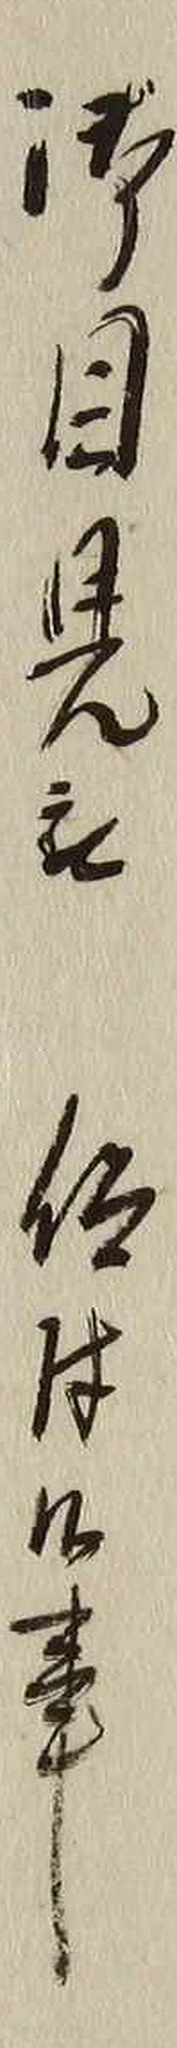御目見被仰付候事
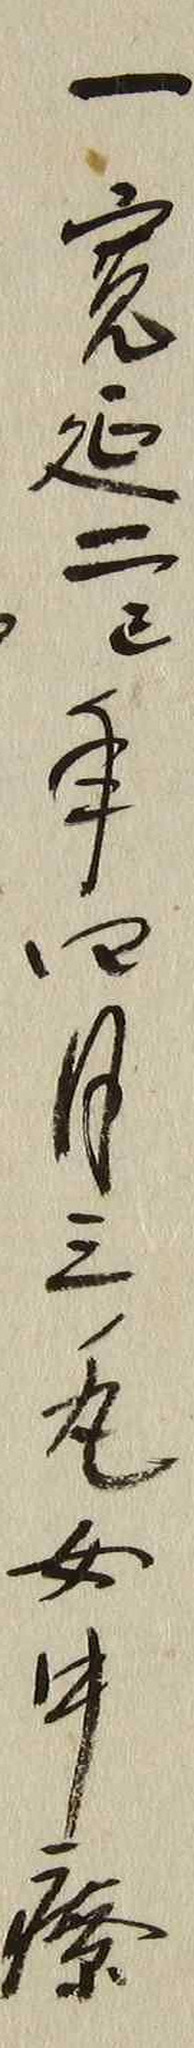一寛延二巳年四月三ノ丸女中療
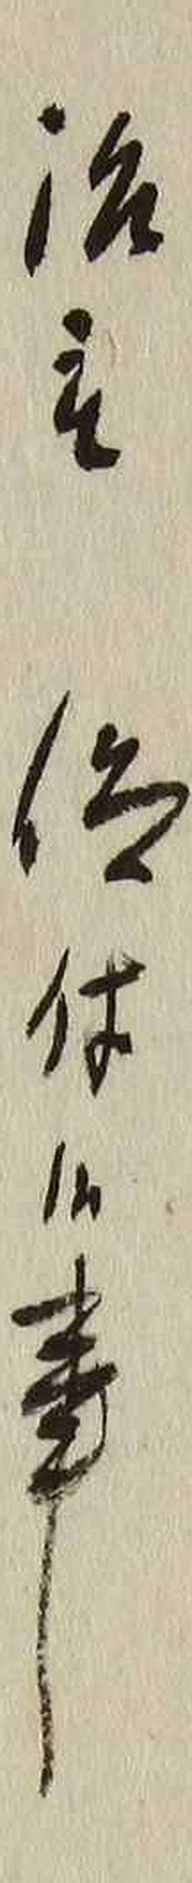治被仰付候事
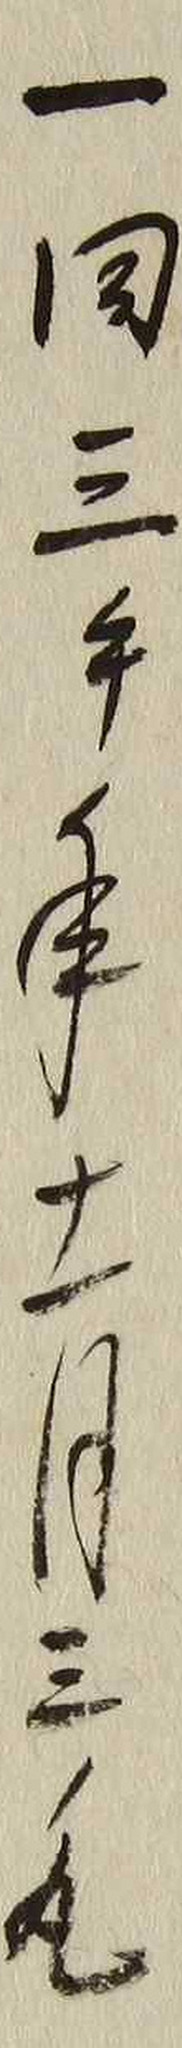一同三午年十一月三ノ丸
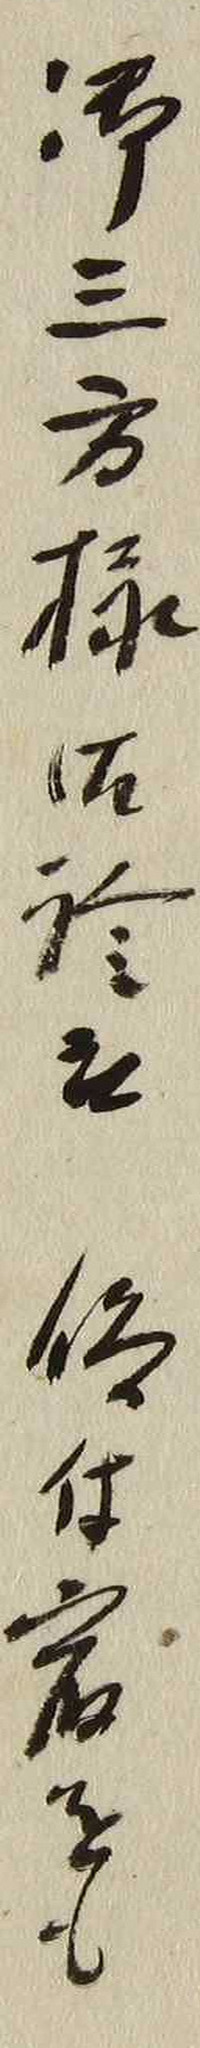御三方様御診被仰付宿をも
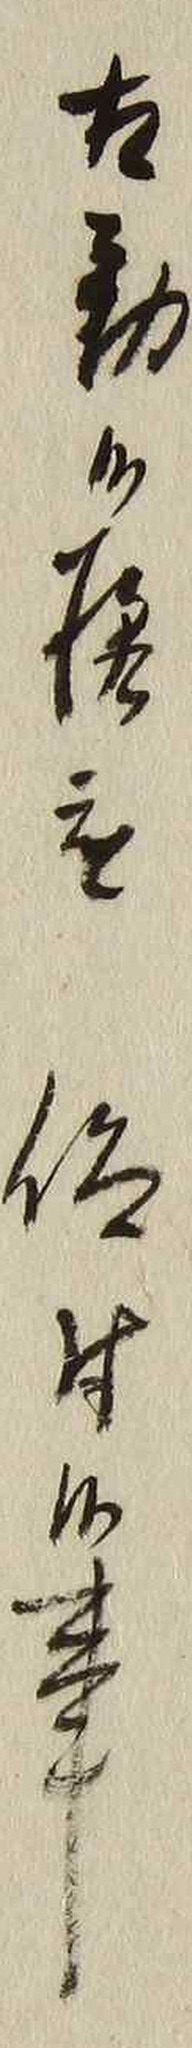相勤候様被仰付候事
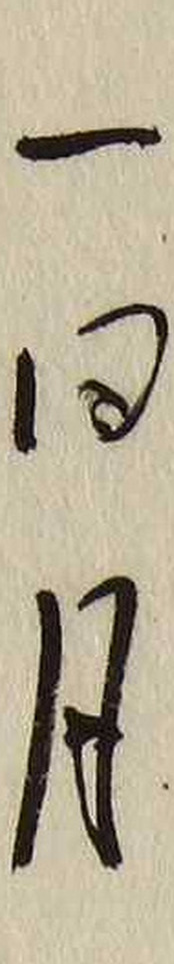一同月
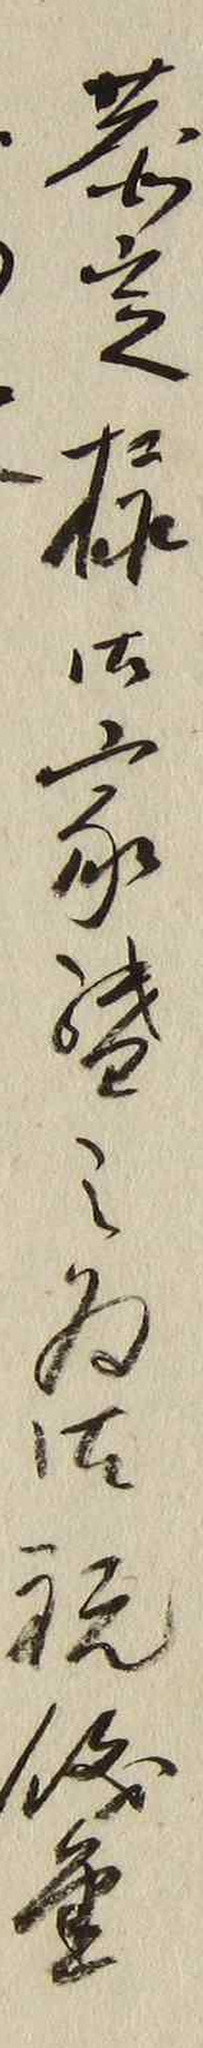恭定様御家督之為御祝儀金
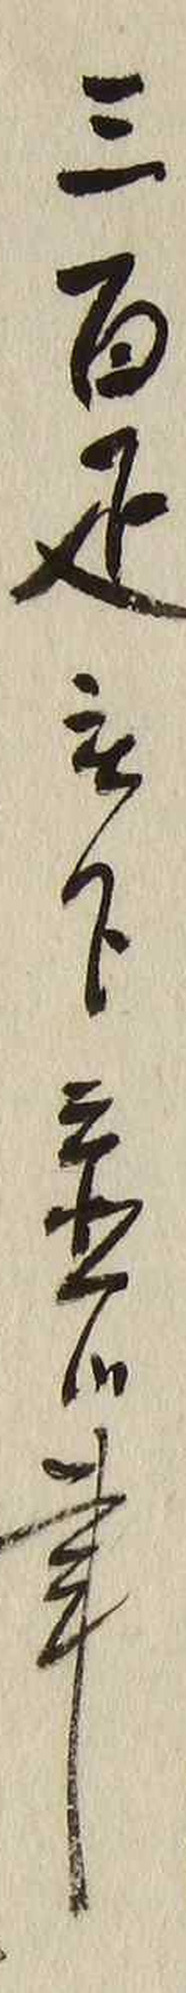三百疋被下置候事
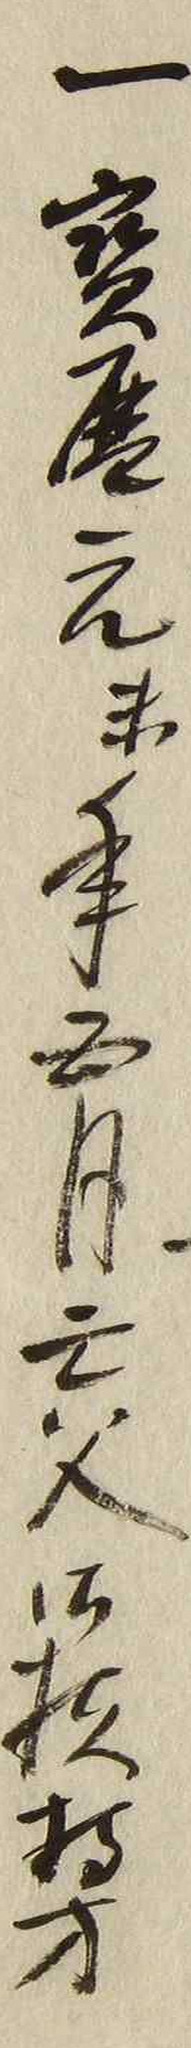一宝暦元未年五月亡父御扶持方

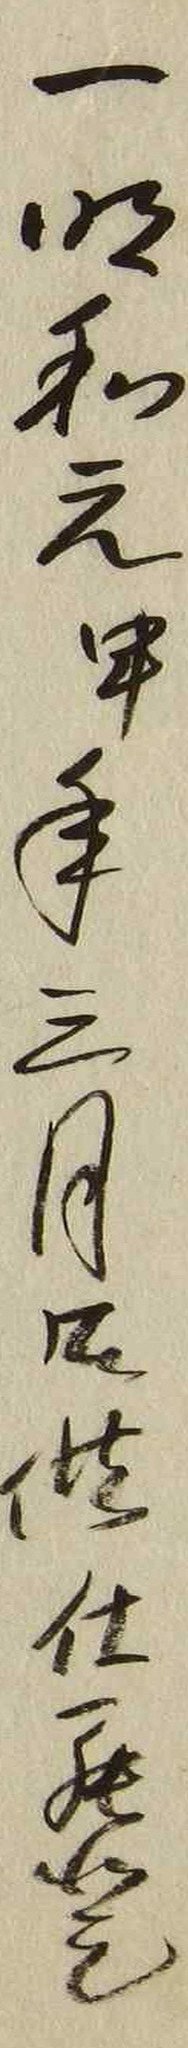一明和元申年三月御供仕罷登
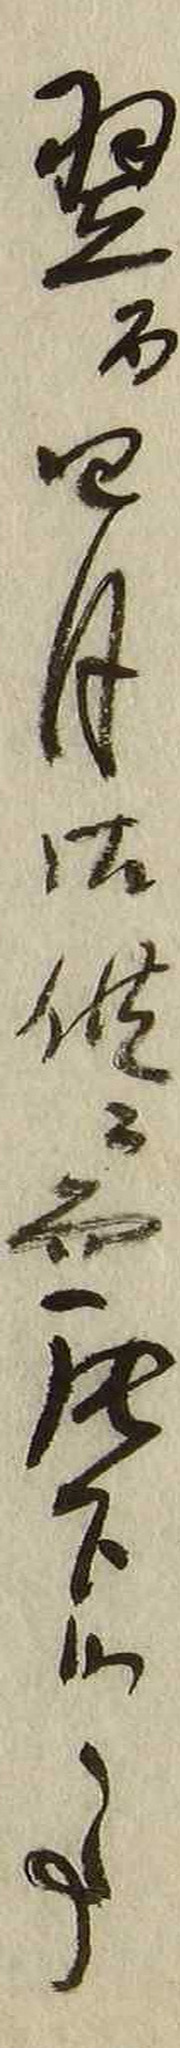翌酉四月御供ニ而罷下候事
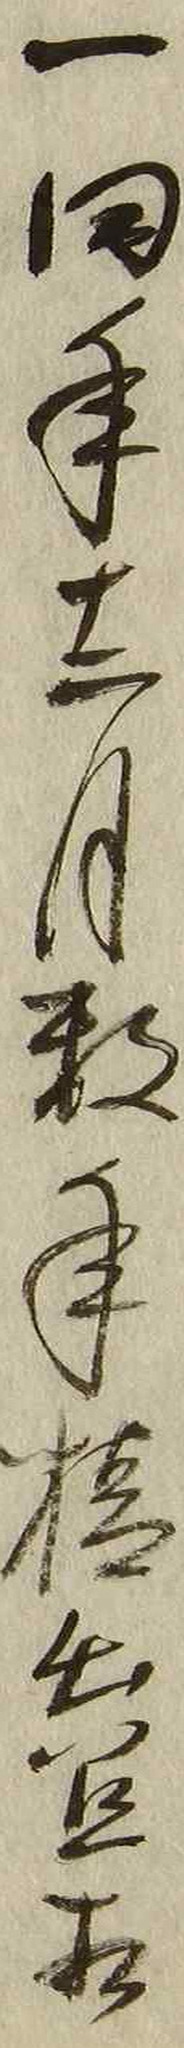一同年十二月数年精出宜相
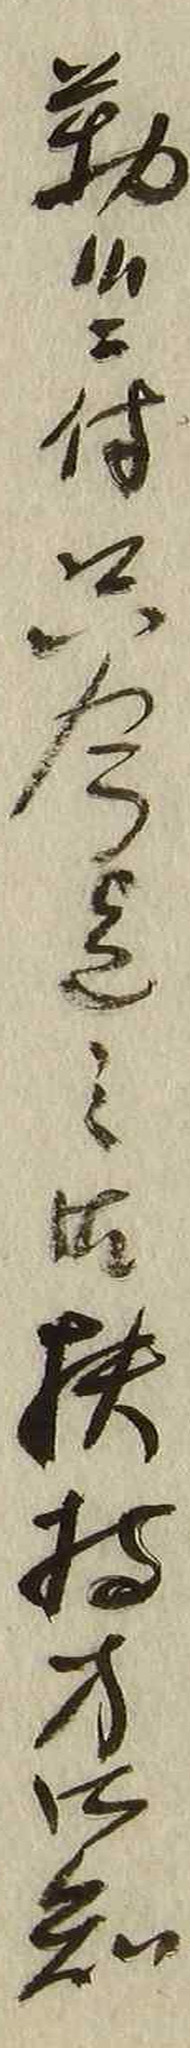勤候ニ付只今迄之御扶持方御知
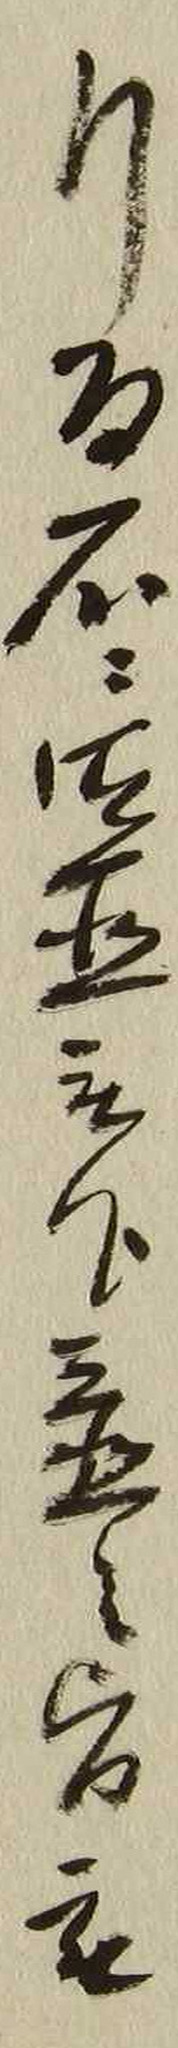行百石ニ御直被下置之旨被
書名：諸士系譜　巻之353　す之部3
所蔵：会津若松市立会津図書館
